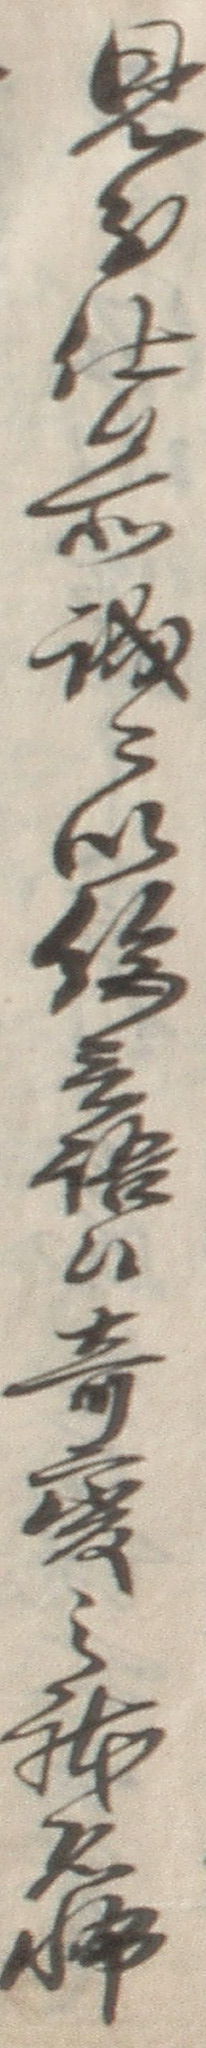見分仕候所誠二以絶言語候奇変之体恐怖
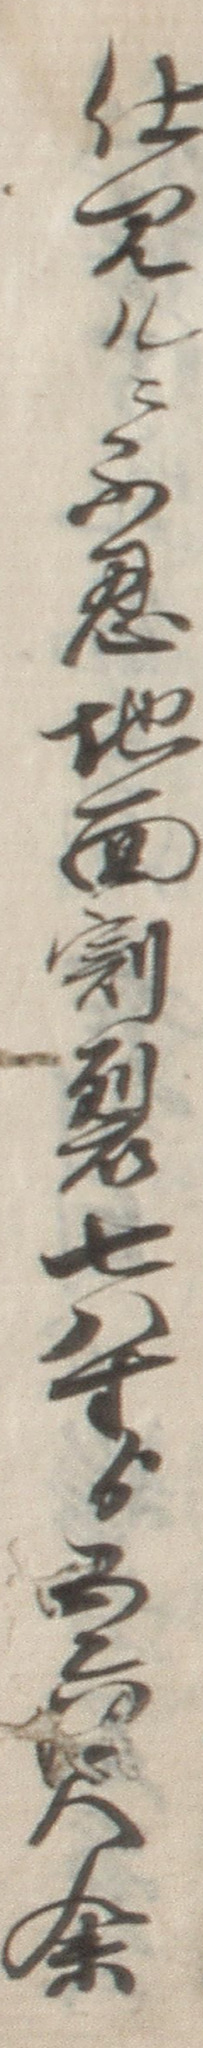仕見ㇽ二不忍地面割裂七八寸ゟ五六尺余

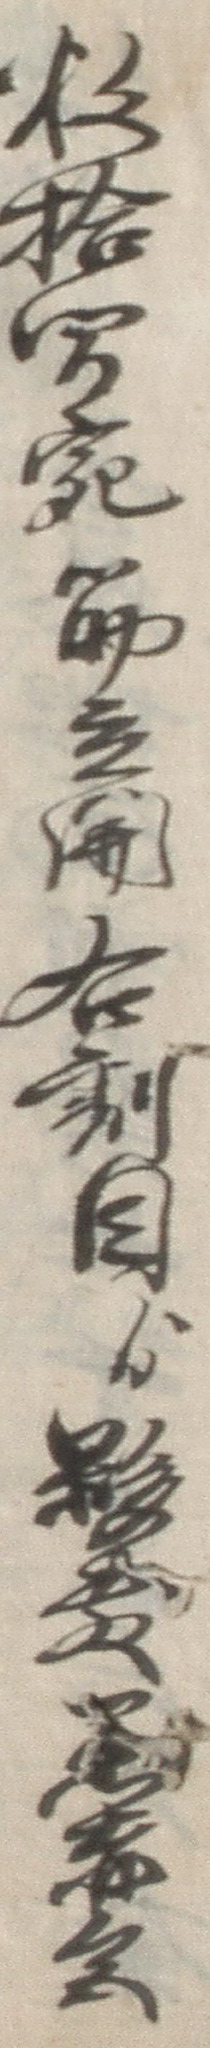数拾間宛筋立開右割目ゟ夥敷黒赤色
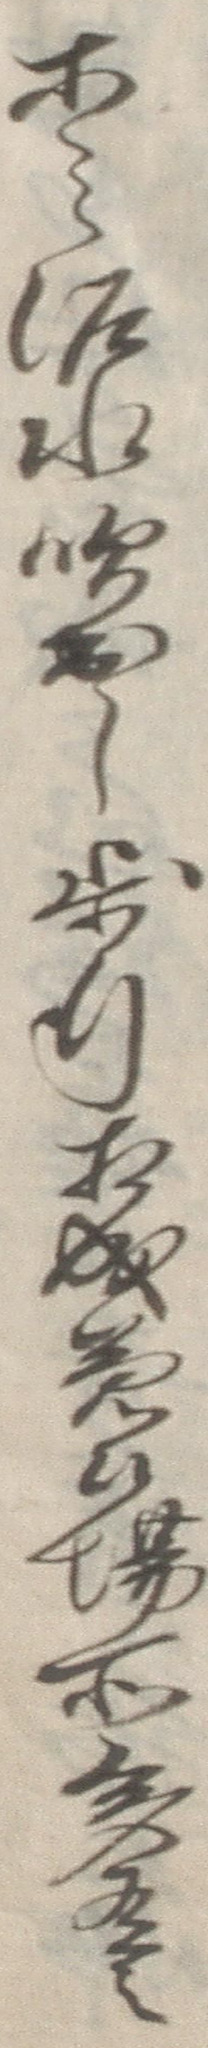等之泥水吹出し歩行相成兼候場所多有之
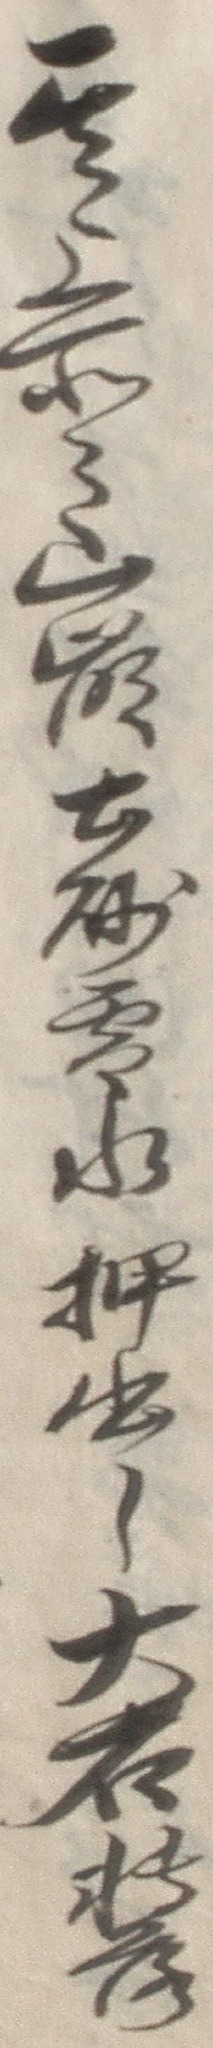其上所々山崩土砂雪水押出し大石転落
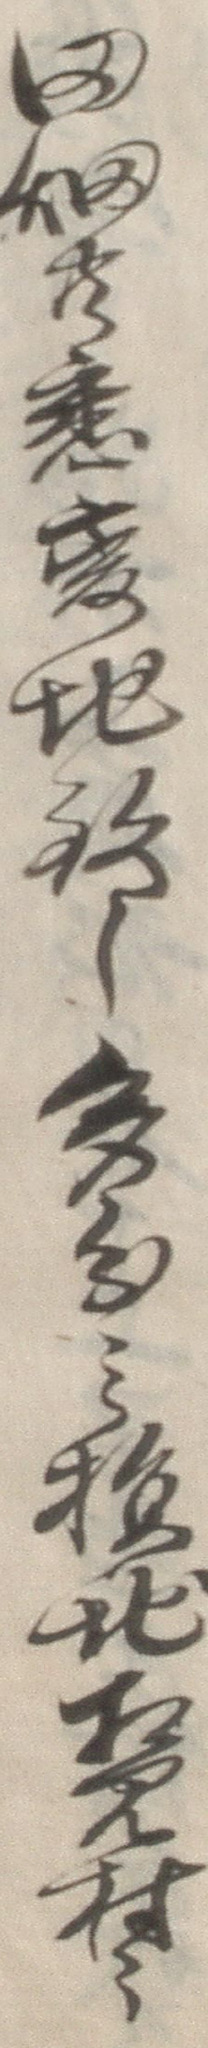田畑共悉変地致し多分之損地相見村々
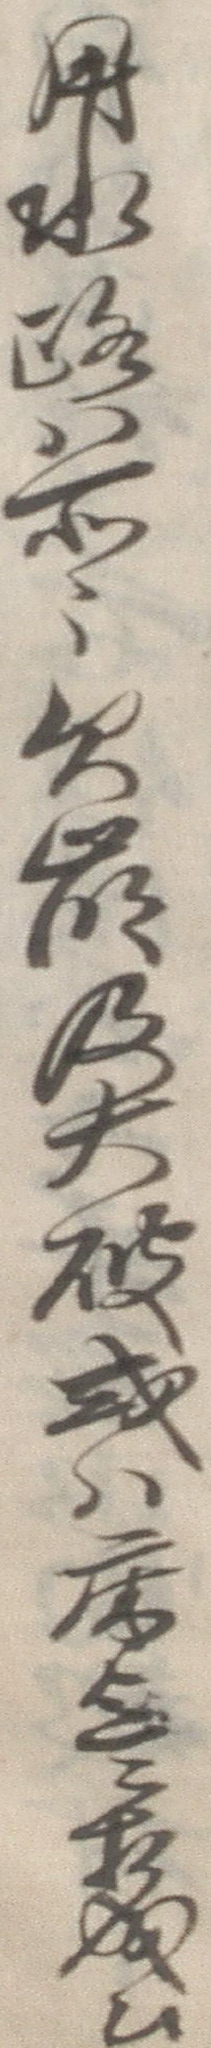用水路ハ所々欠崩及大破或ハ床迄二相成候
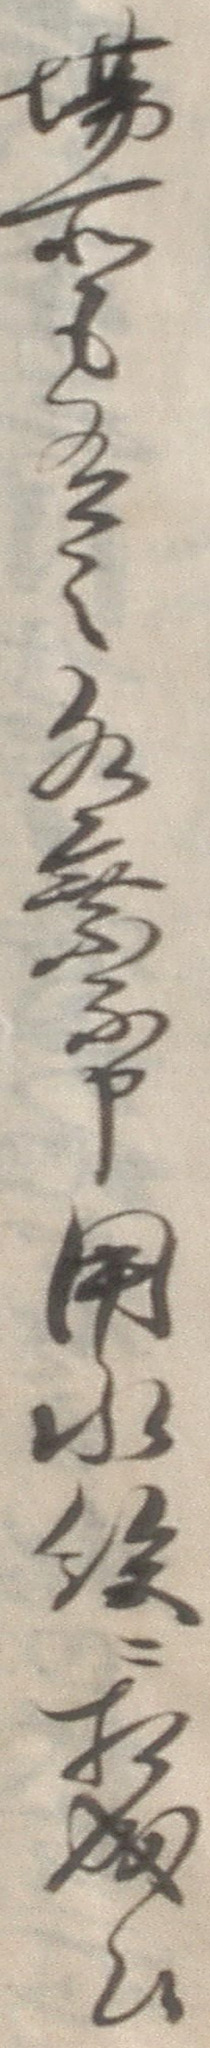場所も有之水乗不申用水絶二相成候
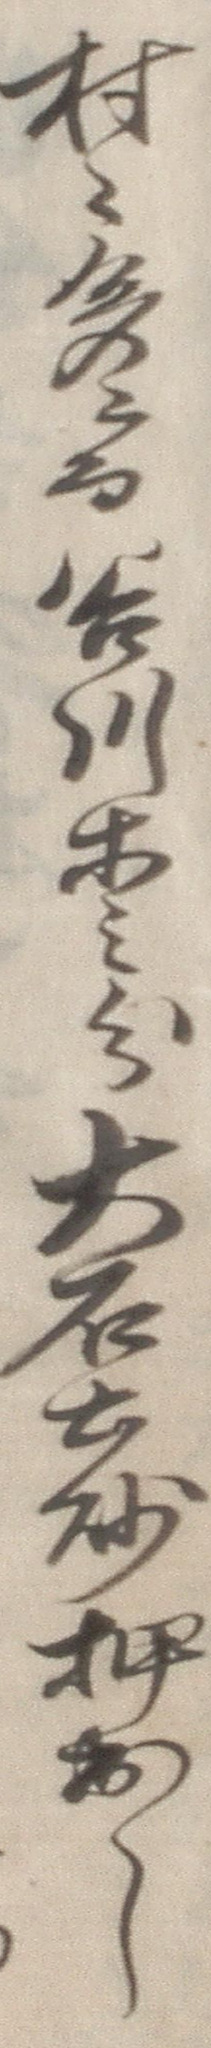村々多二而谷川等之分大石土砂押出し
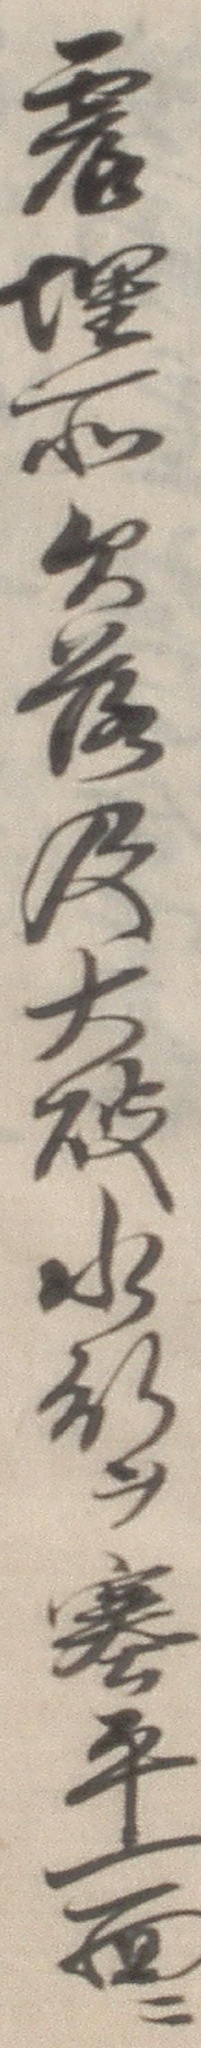震埋所欠落及大破水行ヲ塞平一面二
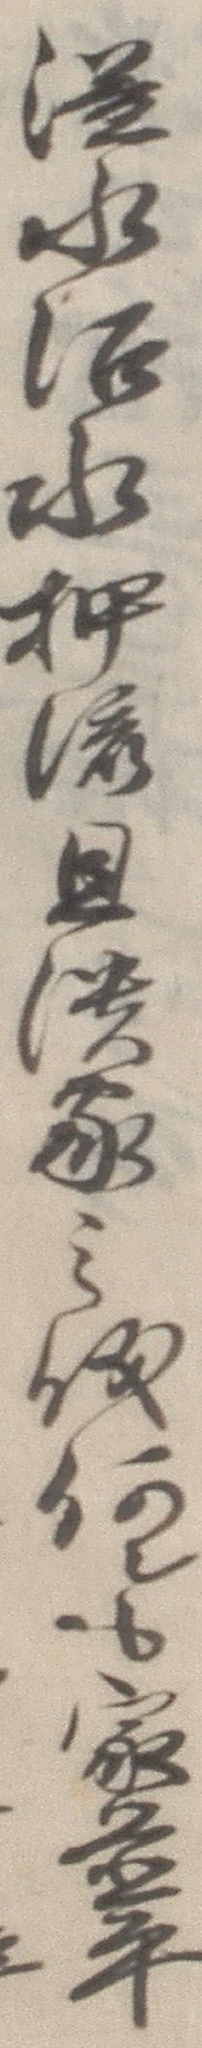溢水泥水押流且潰家之儀何ㇾも家並平
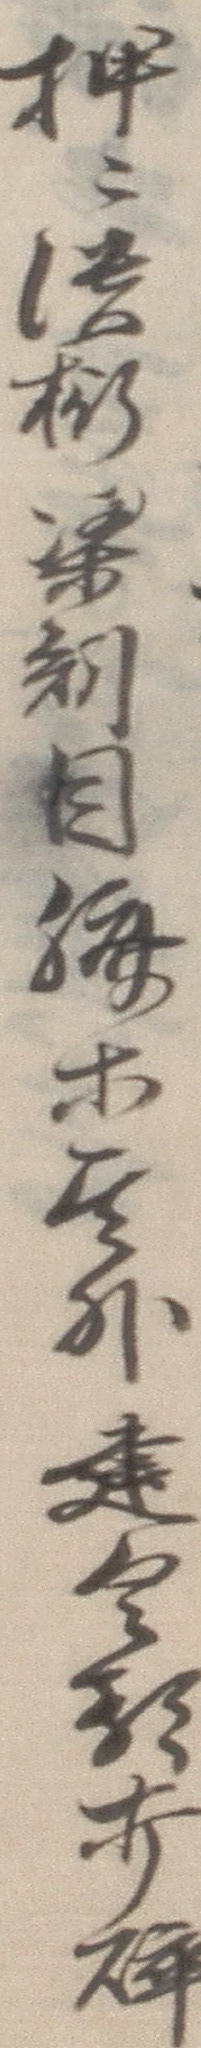押二潰桁梁矧目臍木其外建具類打砕
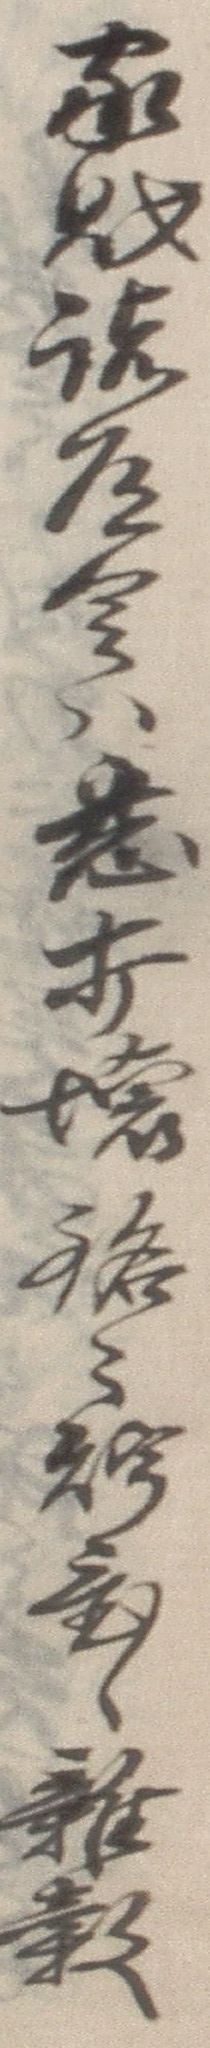家財諸道具ハ悉打壊銘々貯置候雑穀
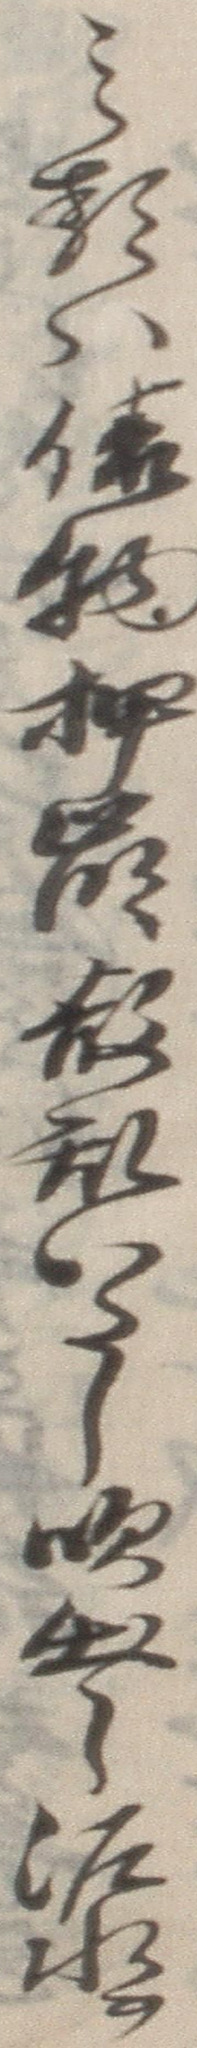之類ハ俵物押崩散乱いたし吹出し泥水ヲ
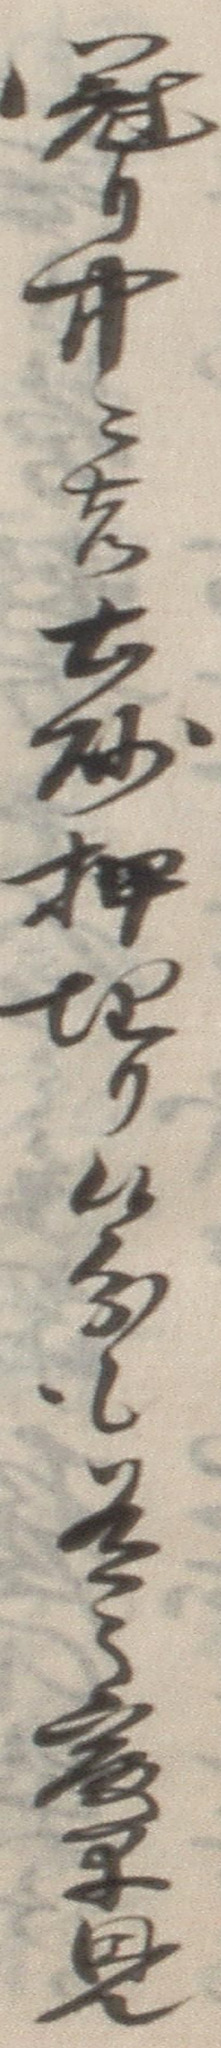冠り中二は土砂押埋り候分も有之,最早見
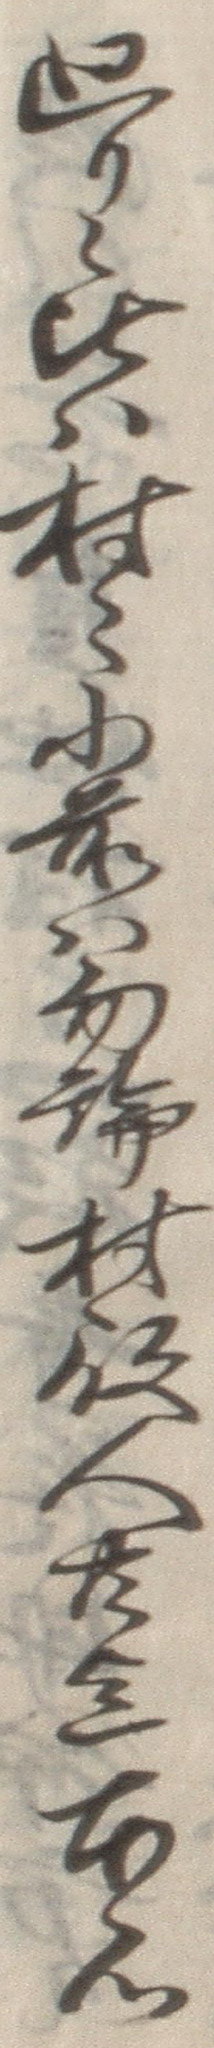廻り候頃ハ村々小前ハ勿論村役人共迄本心
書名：信州地震一件
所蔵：東京大学地震研究所図書室 Earthquake Research Institute Library, The University of Tokyo, JAPAN
